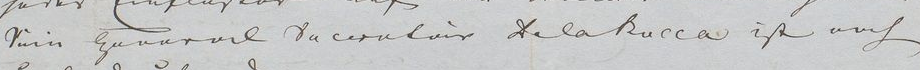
Sein General Secretair De La Rocca ist noch
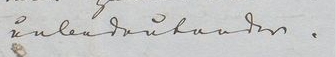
unbedeutender. –
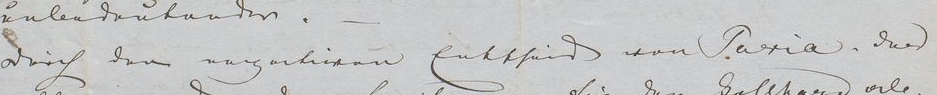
Durch den negativen Entscheid von Pavia, das
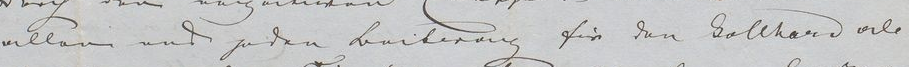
allen und jeden Beitrag für den Gotthard ab-
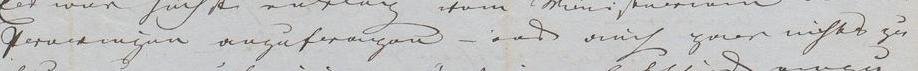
Provinzen anzufragen, und auch gar nichts zu
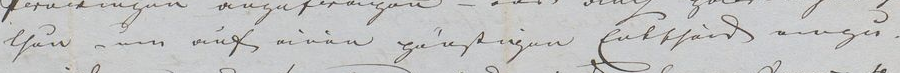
thun, um auf einen günstigen Entscheid einzu-
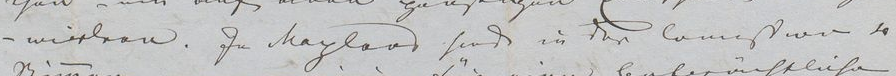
wirken. In Mayland sind in der Comission 4
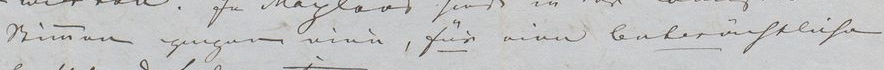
Stimmen gegen eine, für eine beträchtliche
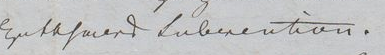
Gotthard Subvention. –
